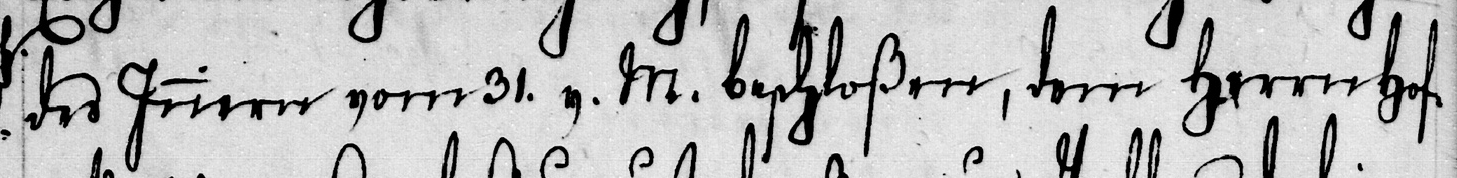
des Innern vom 31. v. M. beschloßen, dem Herrn Hof¬
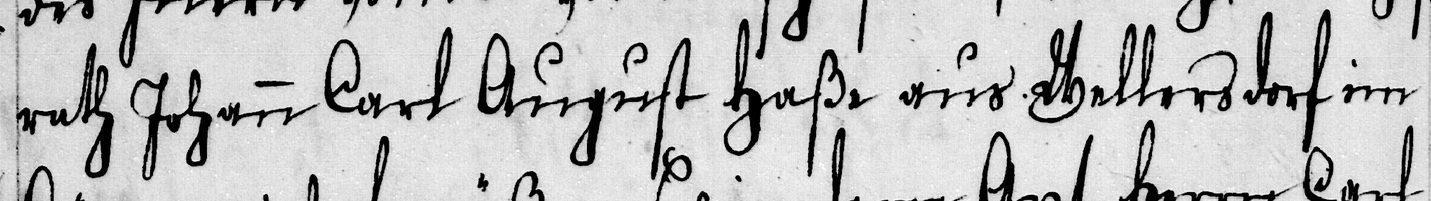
rath Johann Carl August Haße aus Wellersdorf im
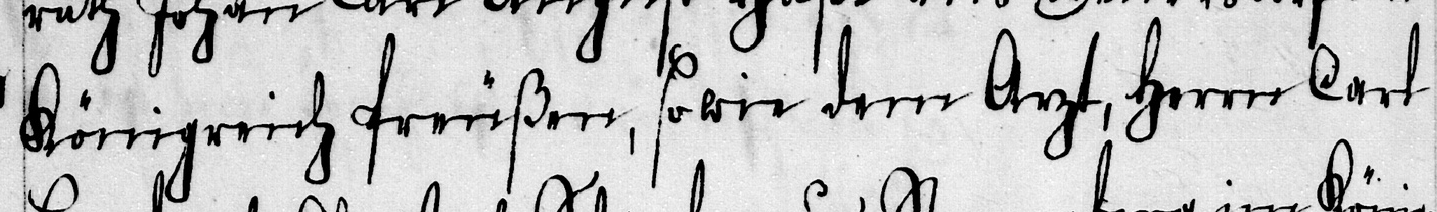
Königreich Preußen, sowie dem Arzt, Herrn Carl
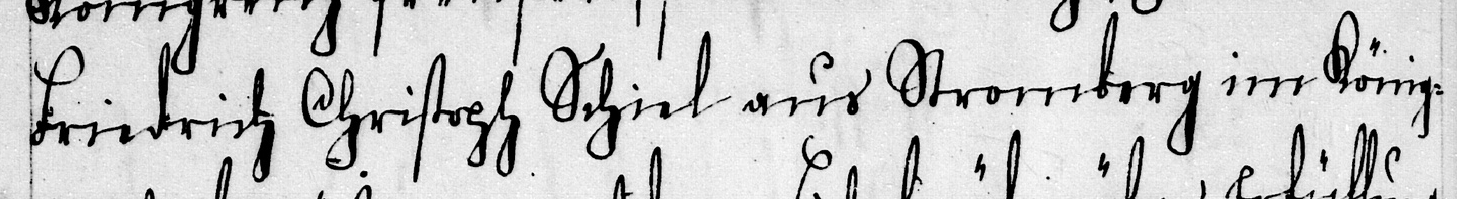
Friedrich Christoph Schiel aus Stromberg im König¬
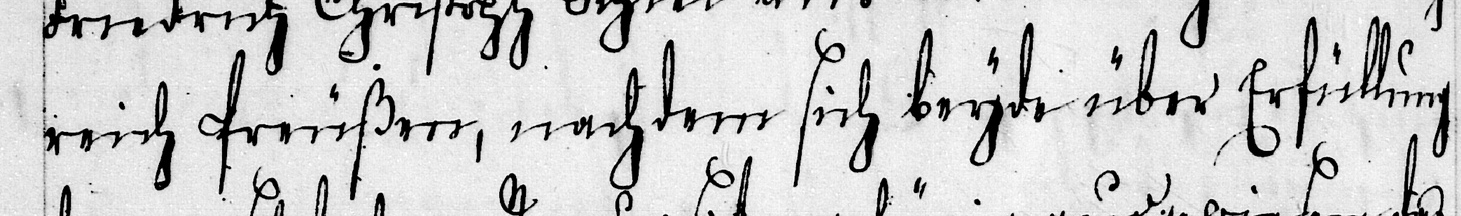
reich Preußen, nachdem sich beyde über Erfüllung
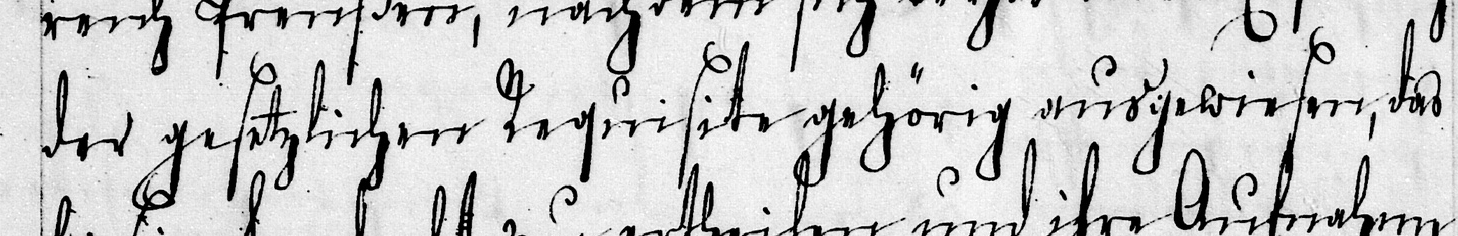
der gesetzlichen Requisite gehörig ausgewiesen, das
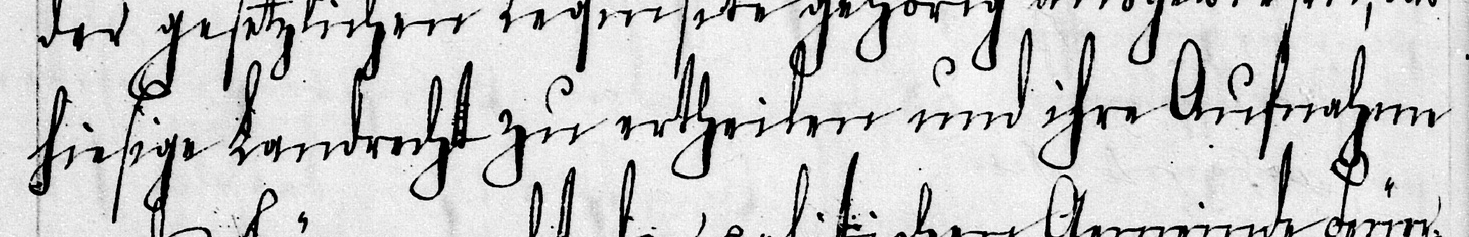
hiesige Landrecht zu ertheilen und ihre Aufnahme
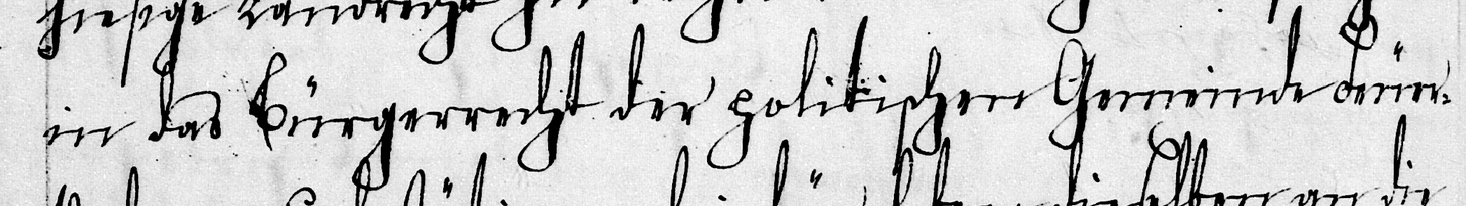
in das Bürgerrecht der politischen Gemeinde Feuer¬
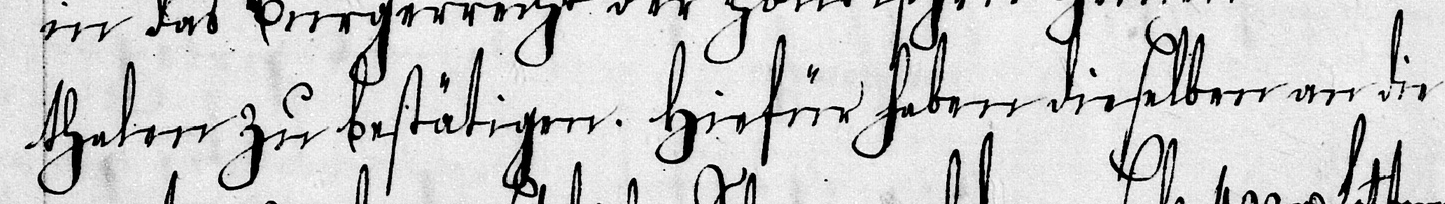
thalen zu bestätigen. Hiefür haben dieselben an die
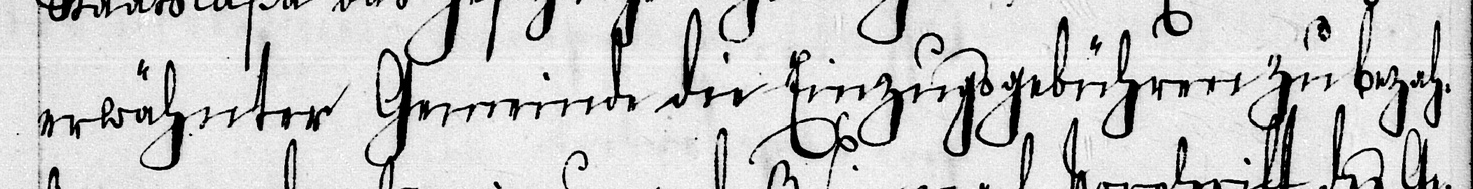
erwähnter Gemeinde die Einzugsgebühren zu bezah¬
